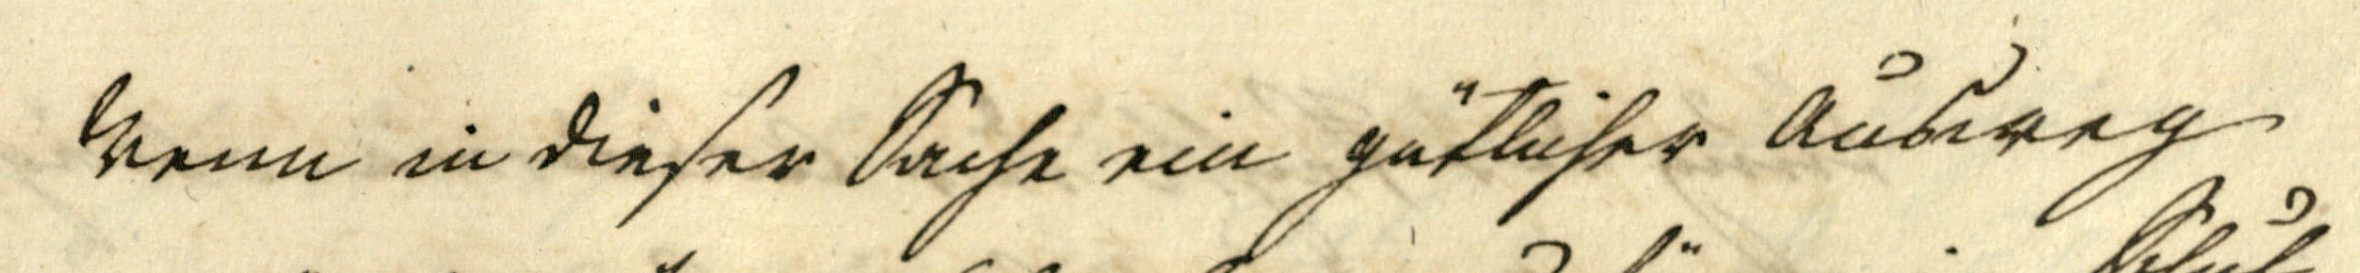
Wenn in dieser Sache ein gütlicher Ausweg
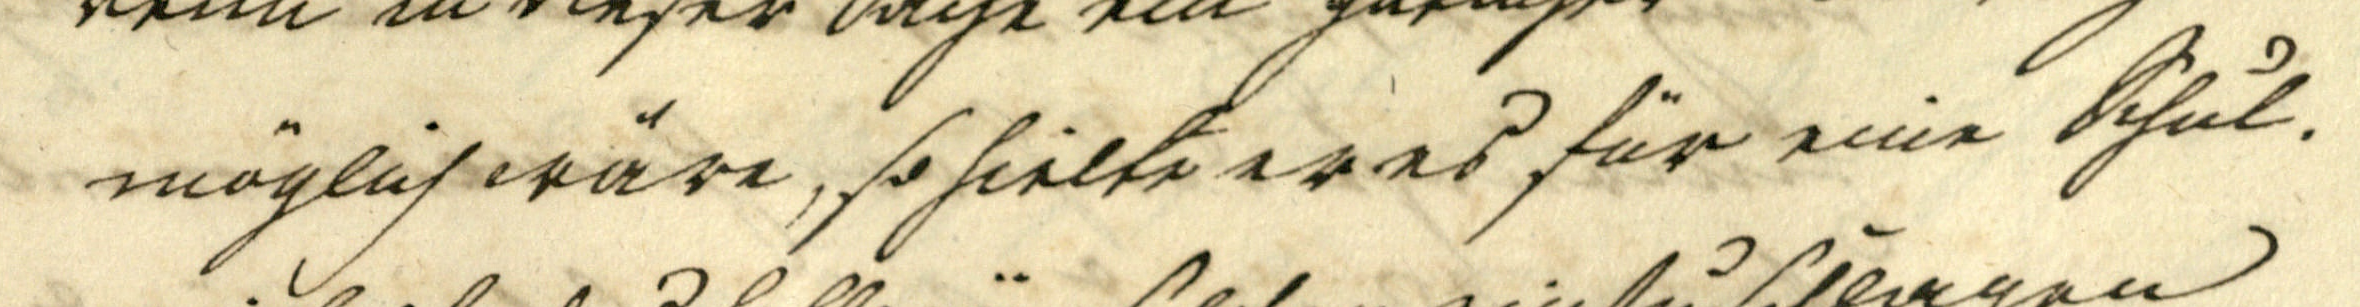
möglich wäre, so hielte er es für eine Schul¬
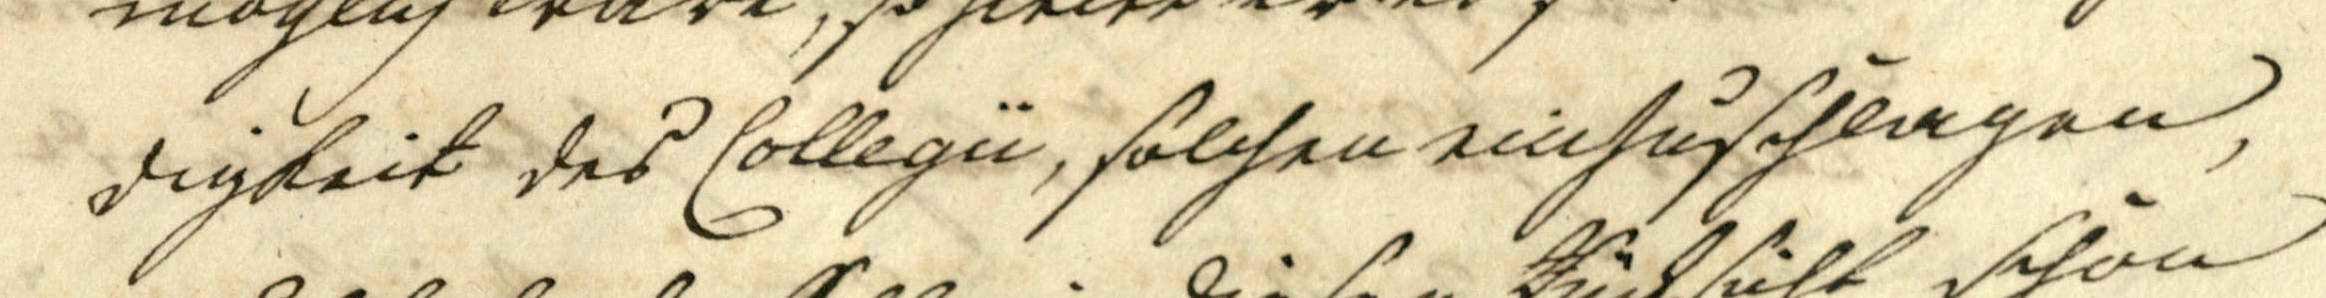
digkeit des Collegii, solchen einzuschlagen,
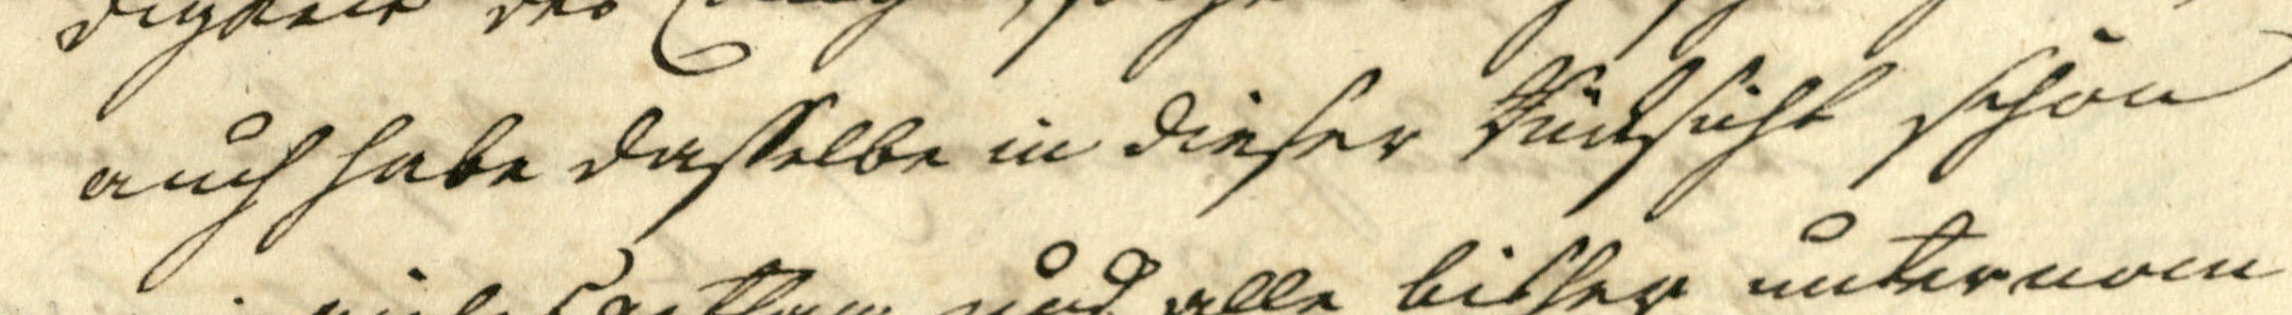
auch habe dasselbe in dieser Rücksicht schon
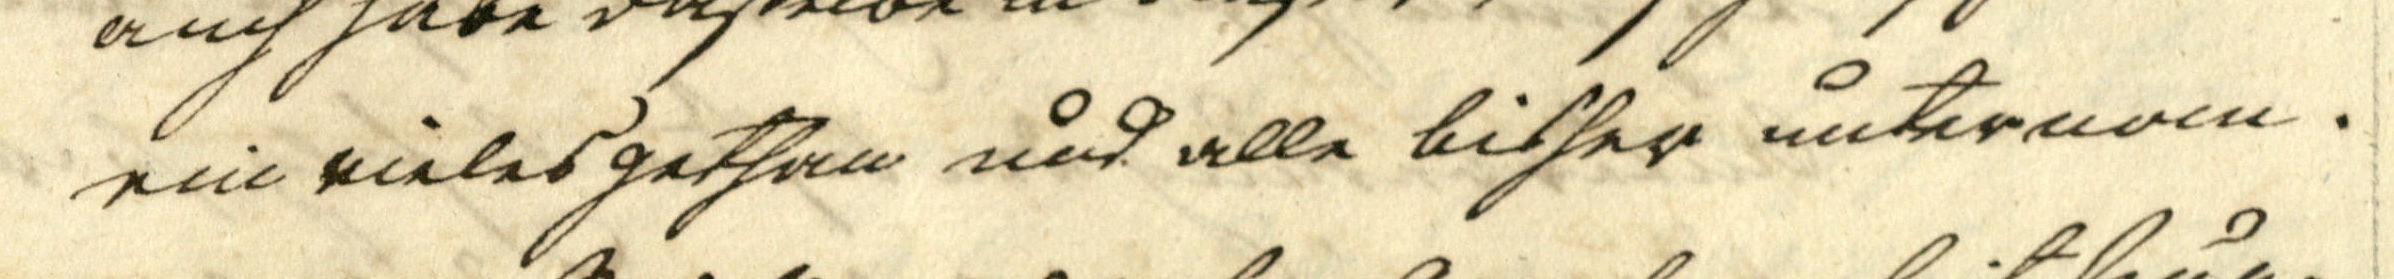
ein vieles gethan und alle bisher unternom¬
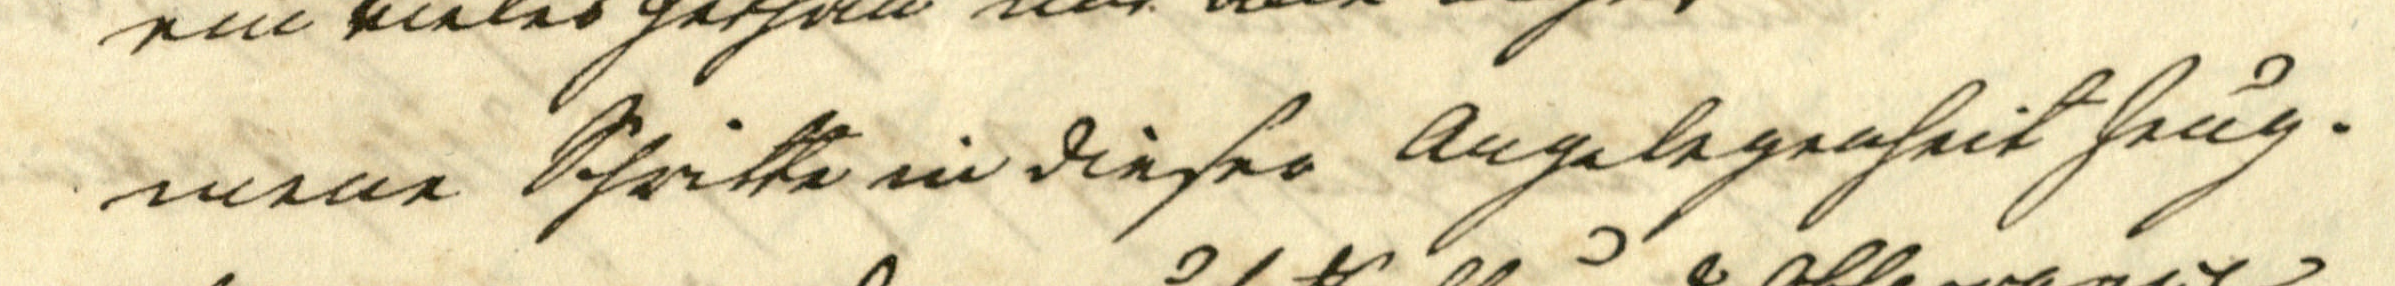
mene Schritte in dieser Angelegenheit zeug¬
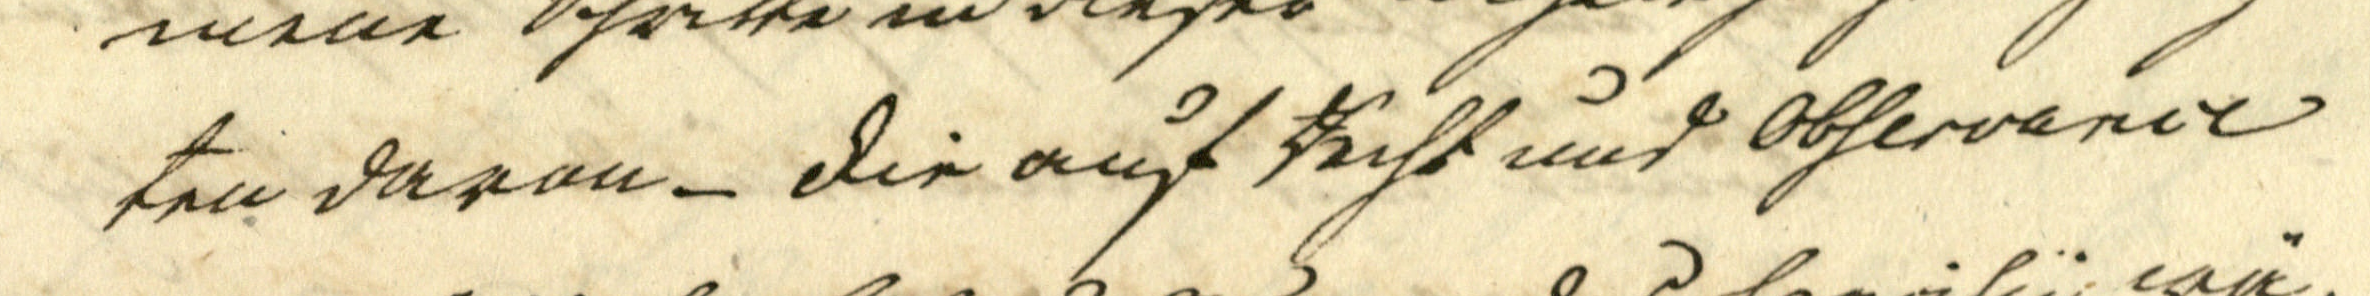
ten davon - die auf Recht und Observance
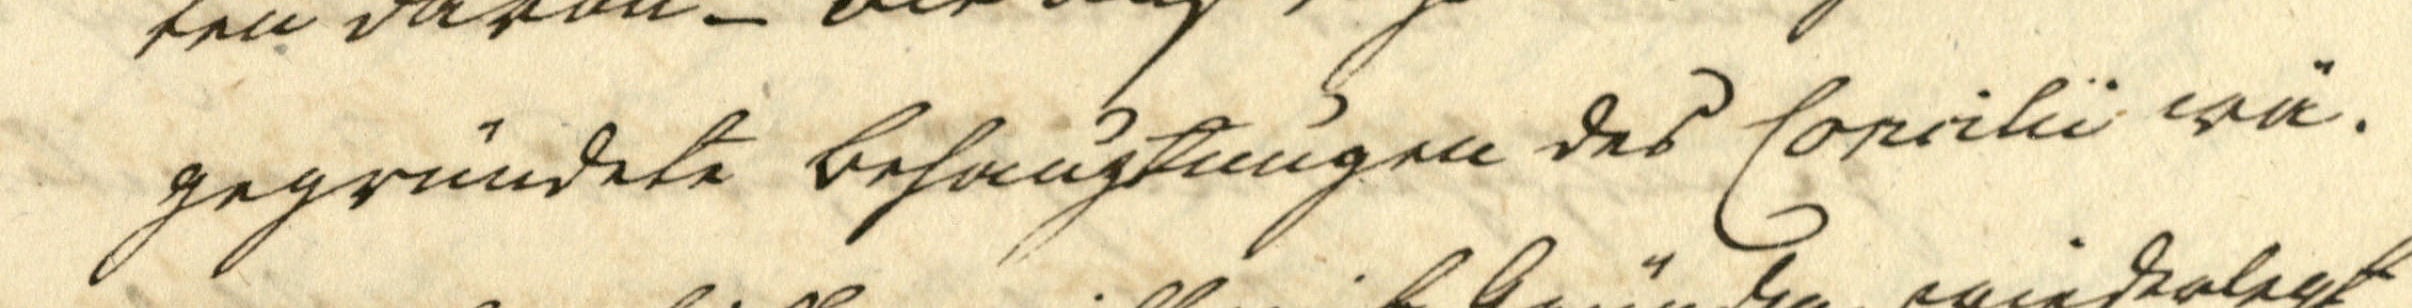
gegründete Behauptungen des Concilii wä¬
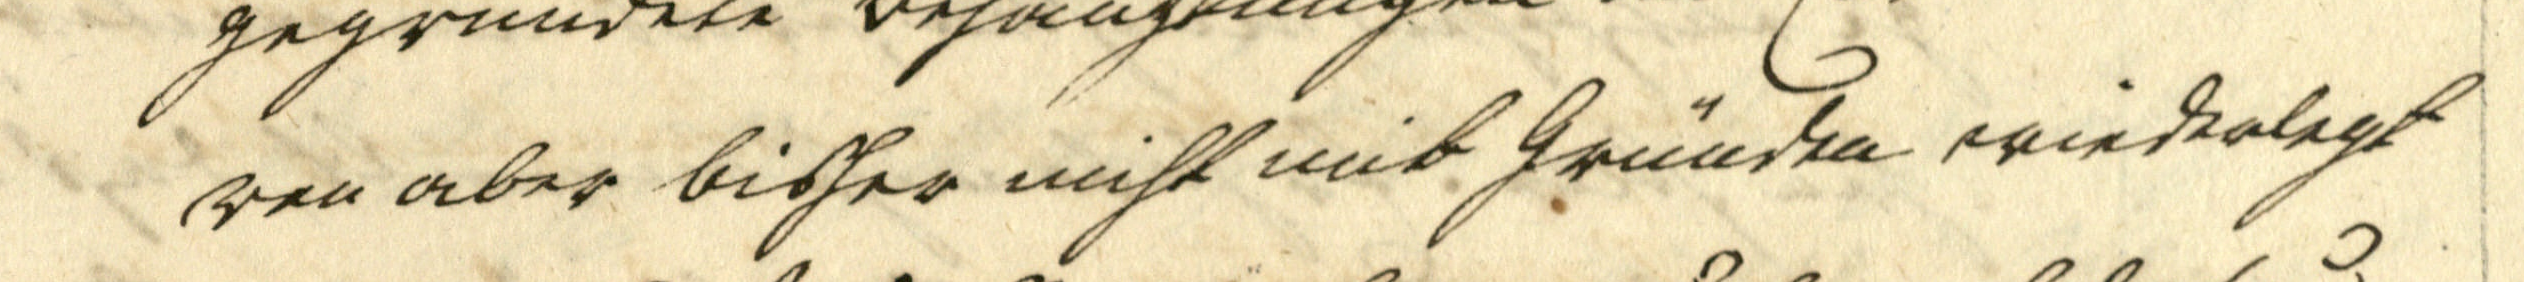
ren aber bisher nicht mit Gründen wiederlegt
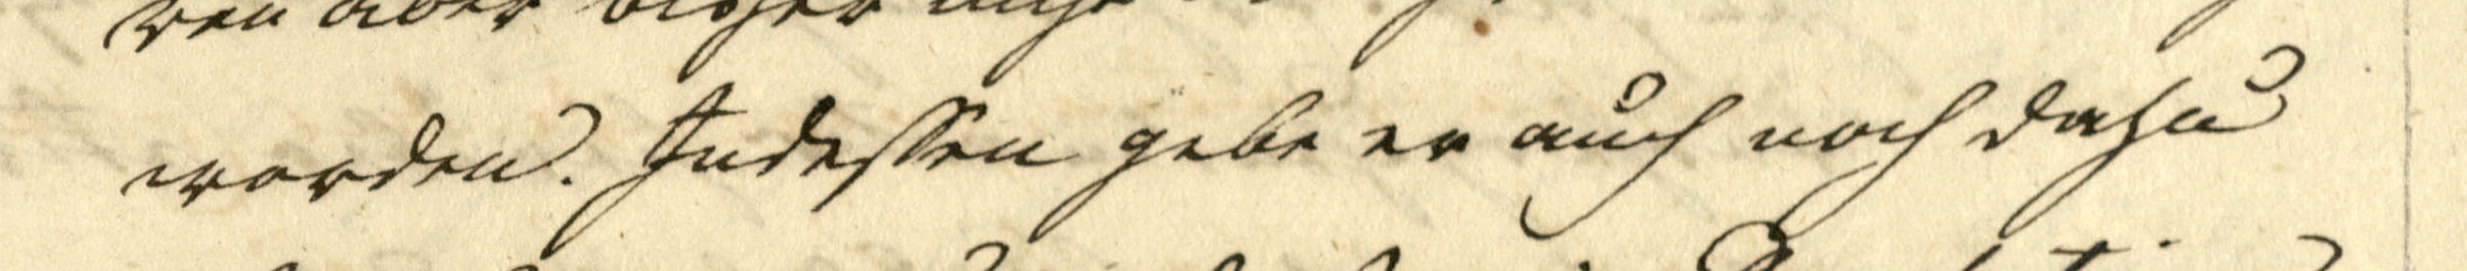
worden. Indessen gebe er auch noch dazu
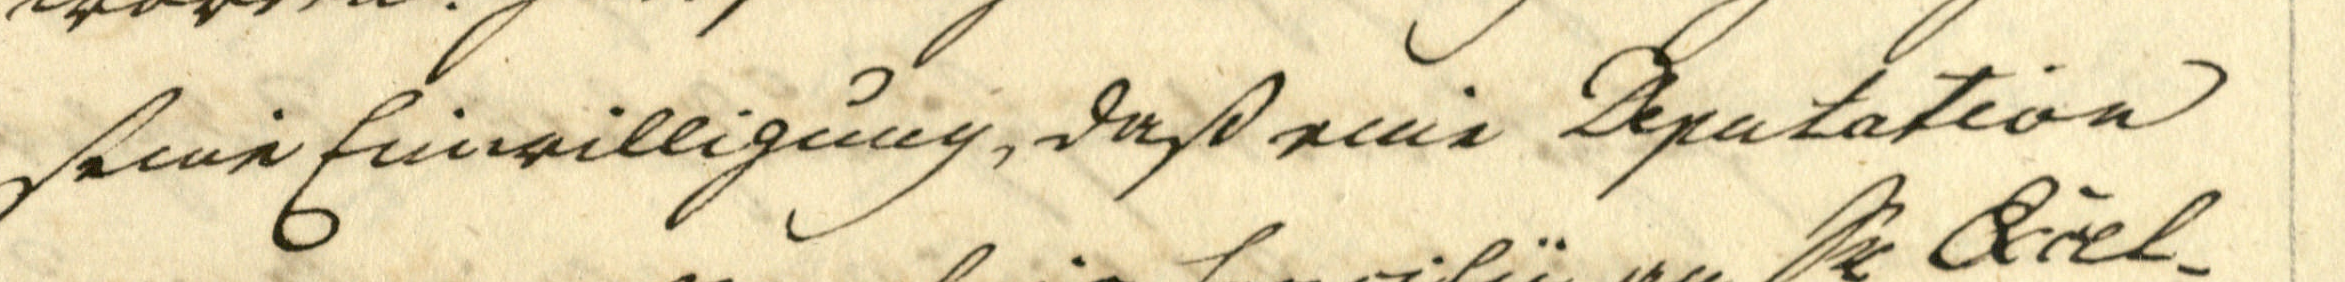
seine Einwilligung, daß eine Deputation
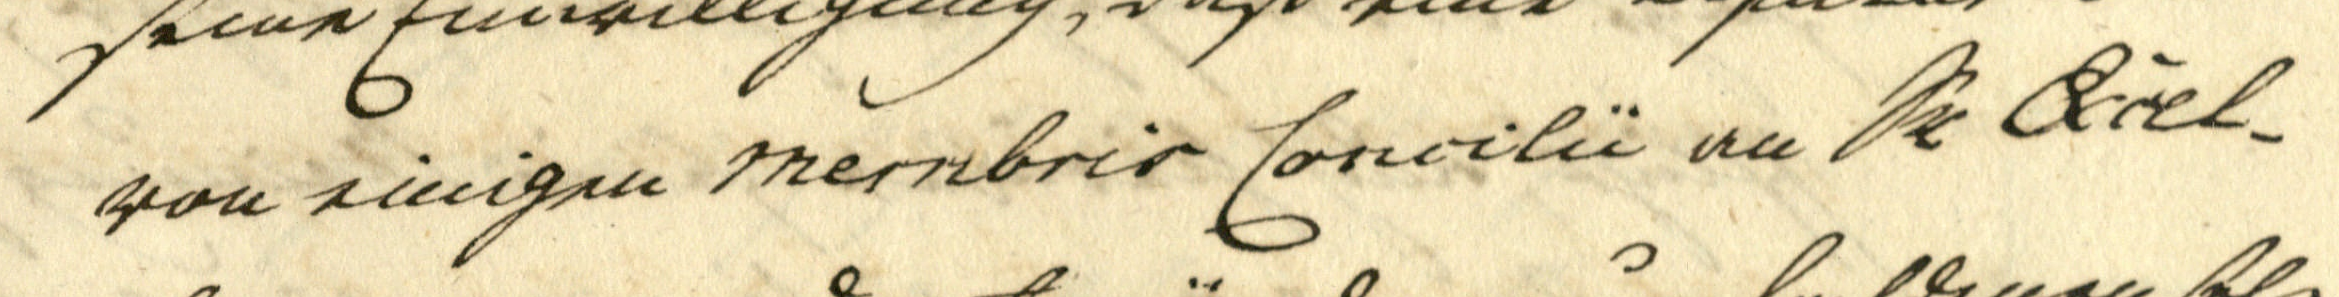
von einigen Membris Concilii an Sr. Excel¬
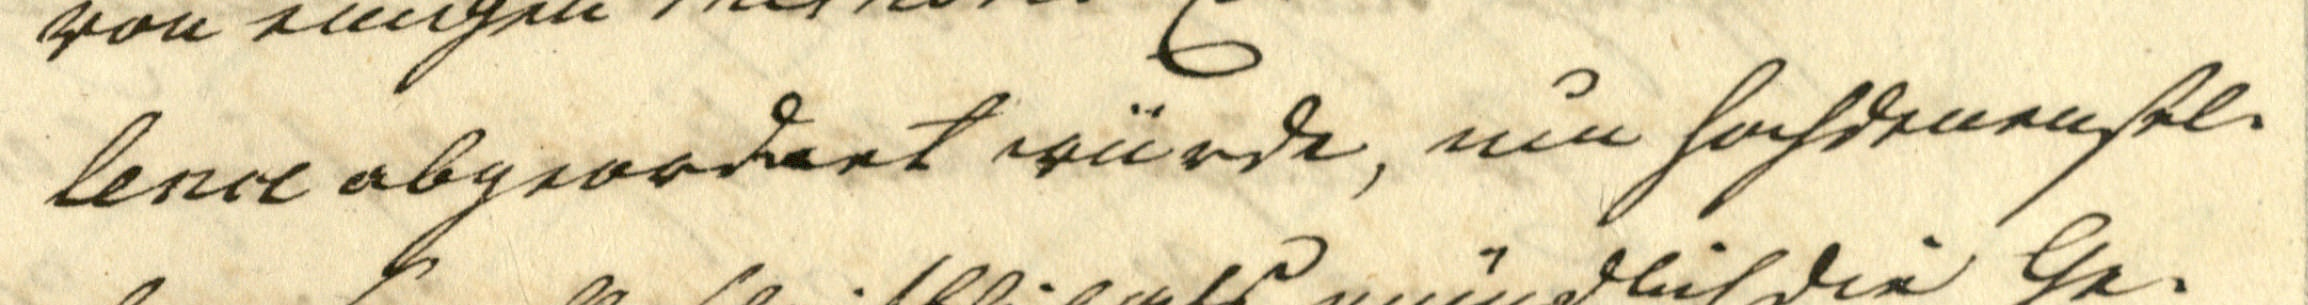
lence abgeordenet würde, um hochdenensel¬
